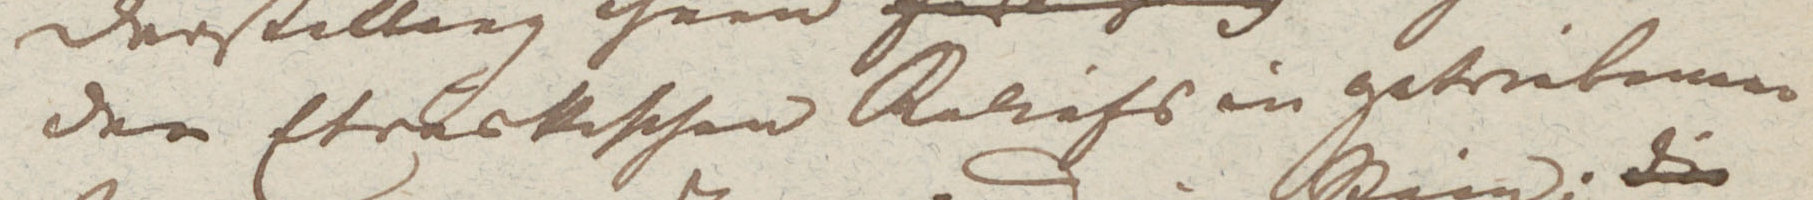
den Etruskischen Reliefs in getriebenem
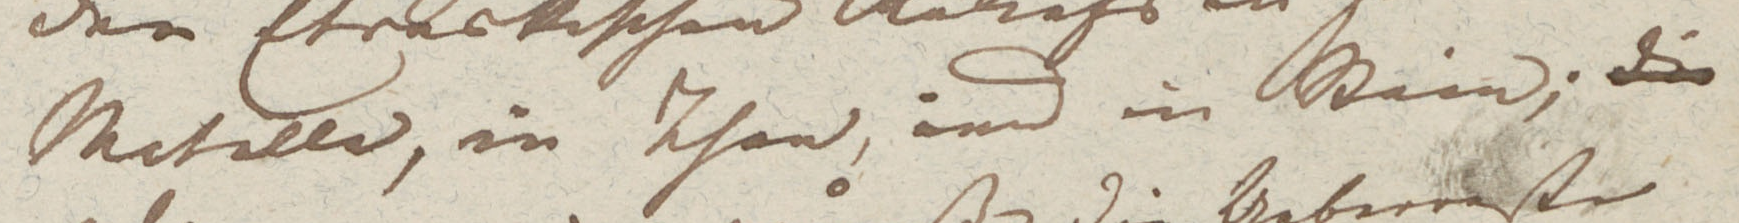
Metalle, in Thon, und in Stein; die
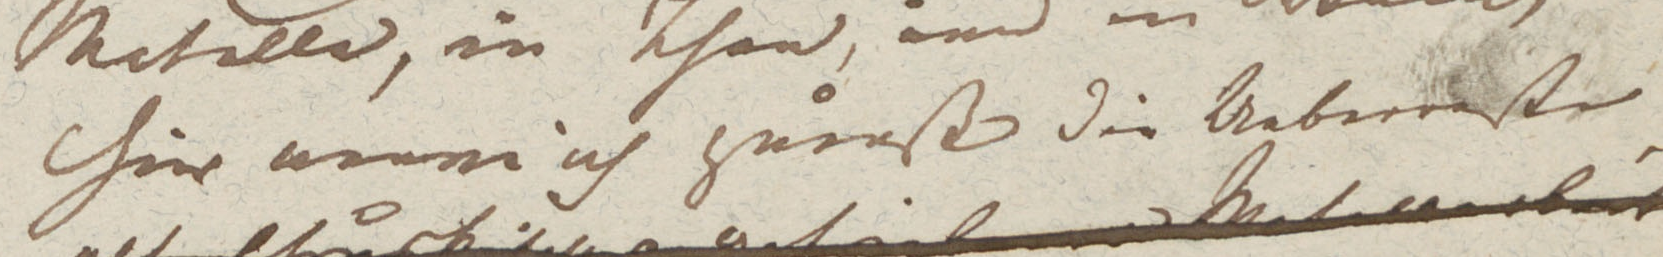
Hier nenne ich zuerst die Ueberreste
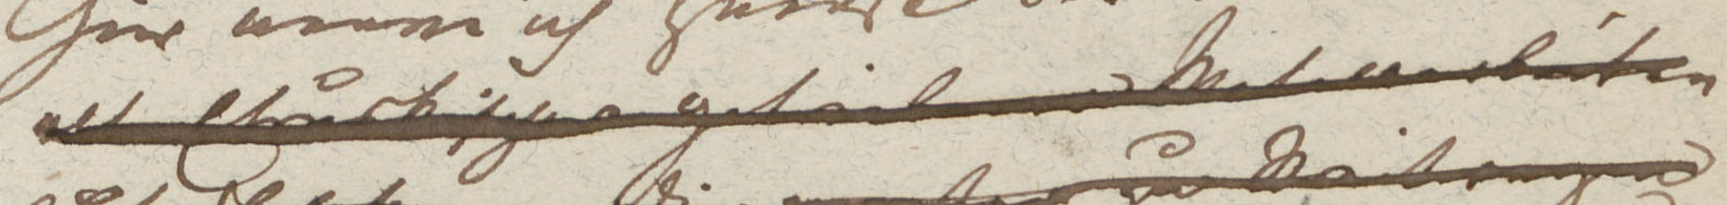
alt Etruskischer getriebener Metallarbeiten
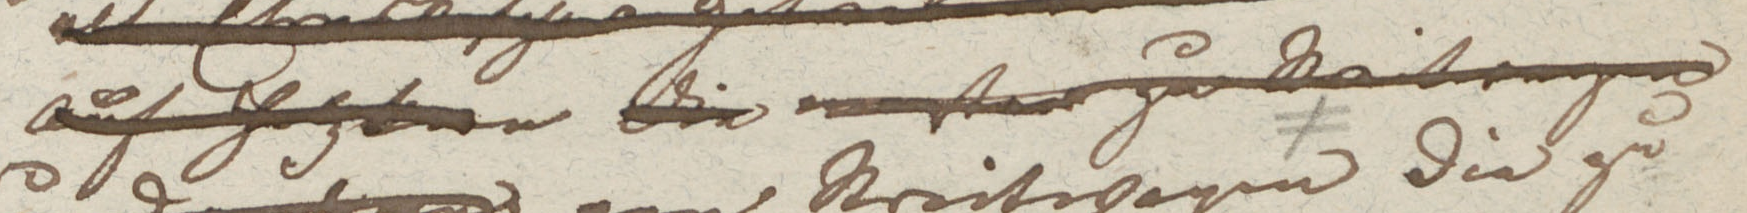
auf Holzkern die st zu Streitwagen
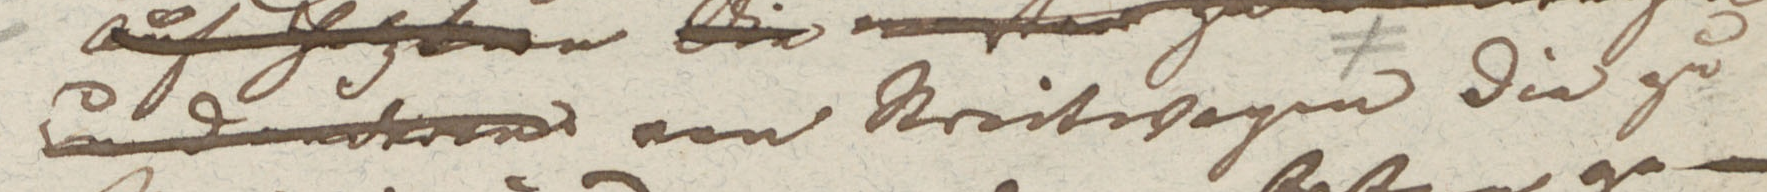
und anderen von Streitwagen % die zu
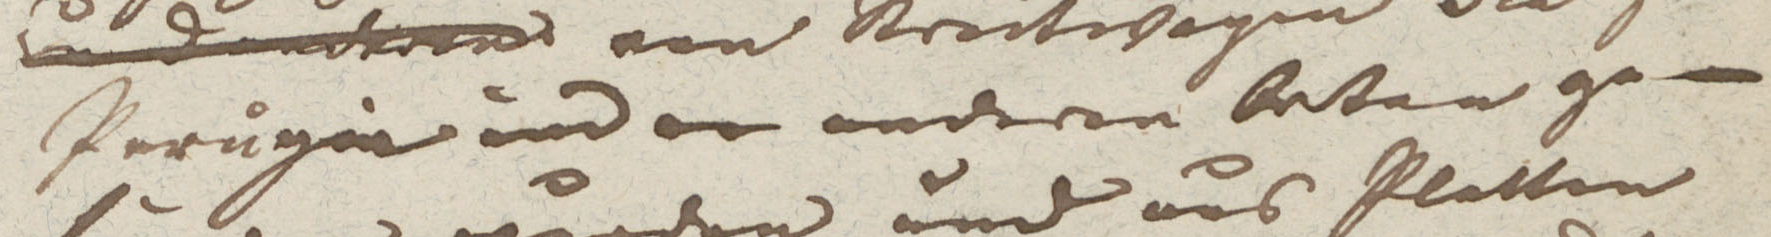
Perugia und an anderen Orten ge-
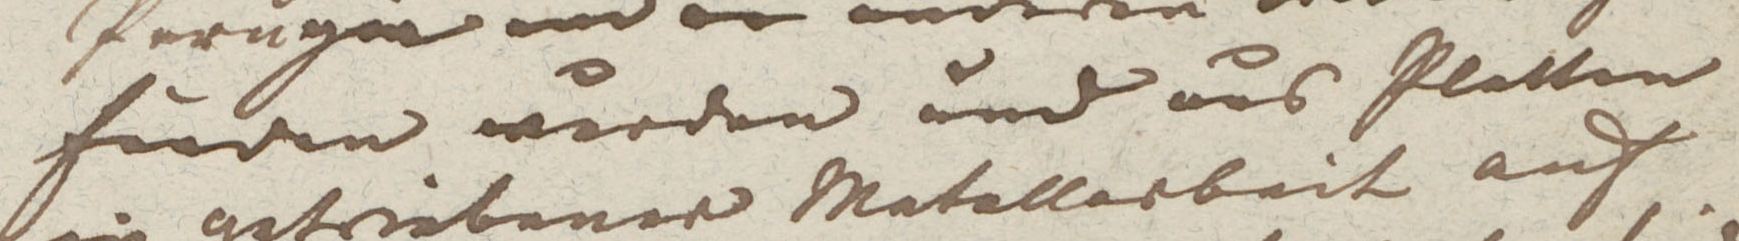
funden wurden und aus Platten
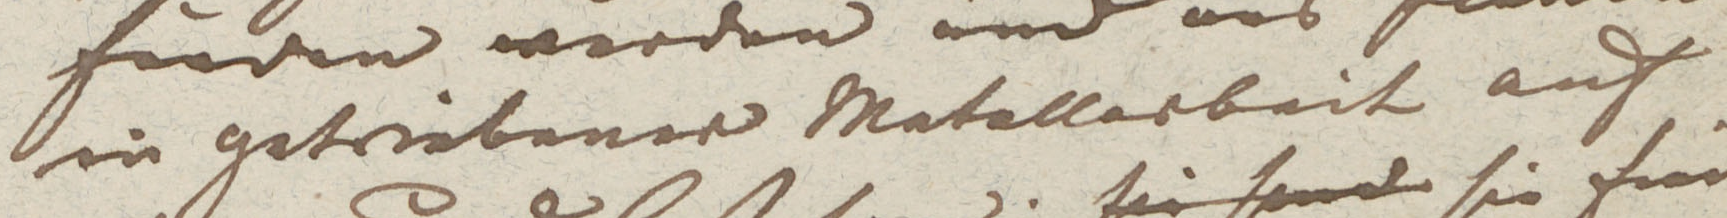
in getriebener Metallarbeit auf
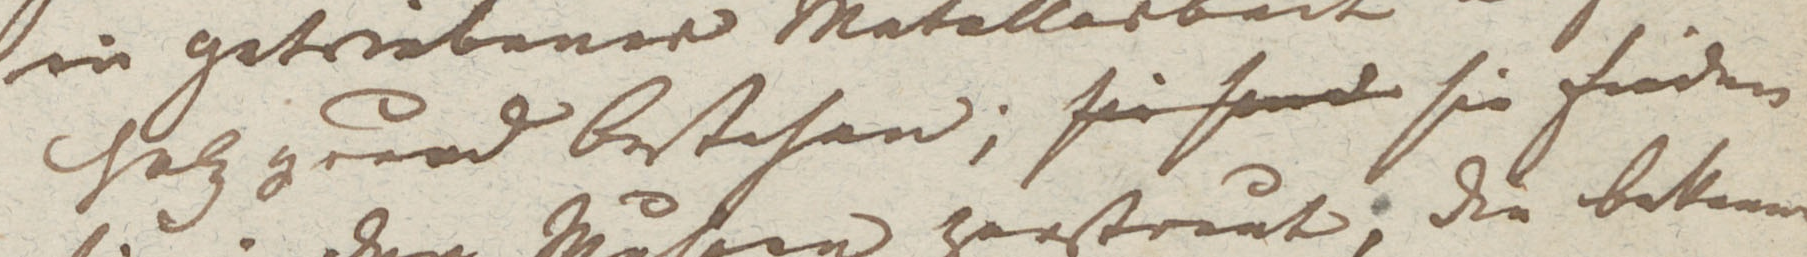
Holz grund bestehen; sie sind sie finden
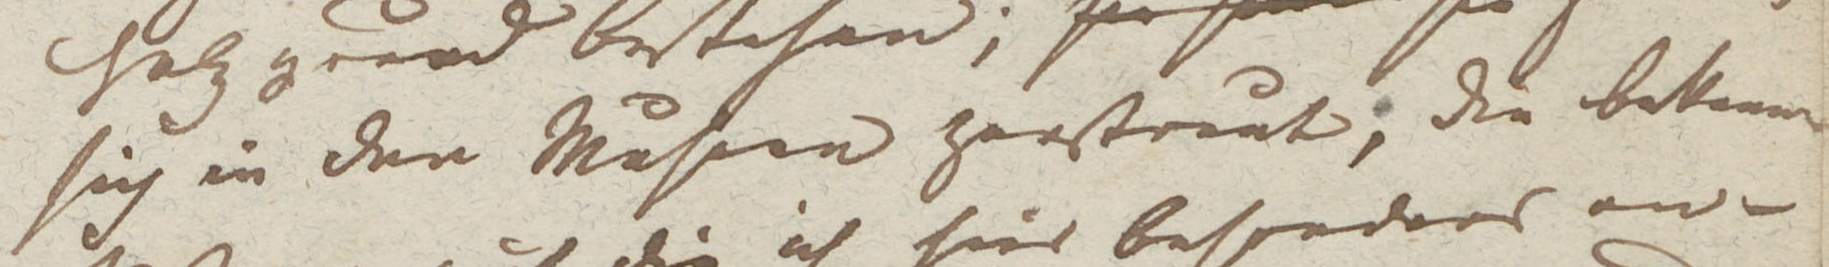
sich in den Museen zerstreut,; die bekann-
